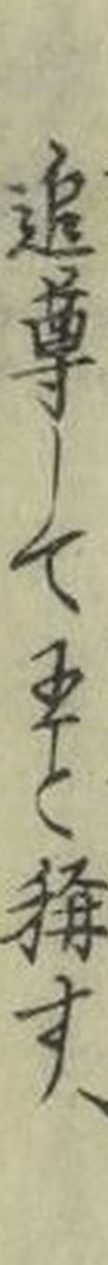追尊して王と称す、

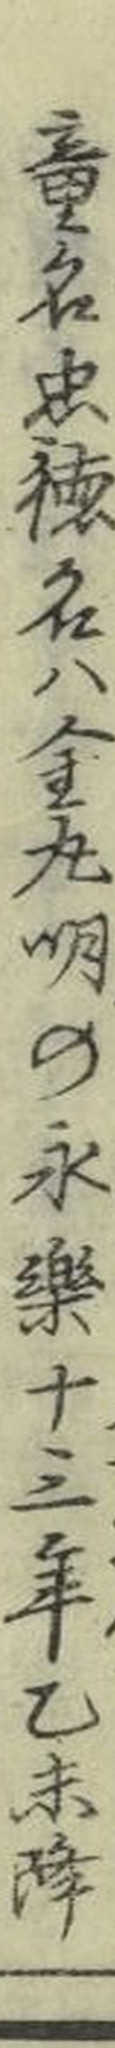童名忠徳、名は金丸、明の永楽十三年乙未降
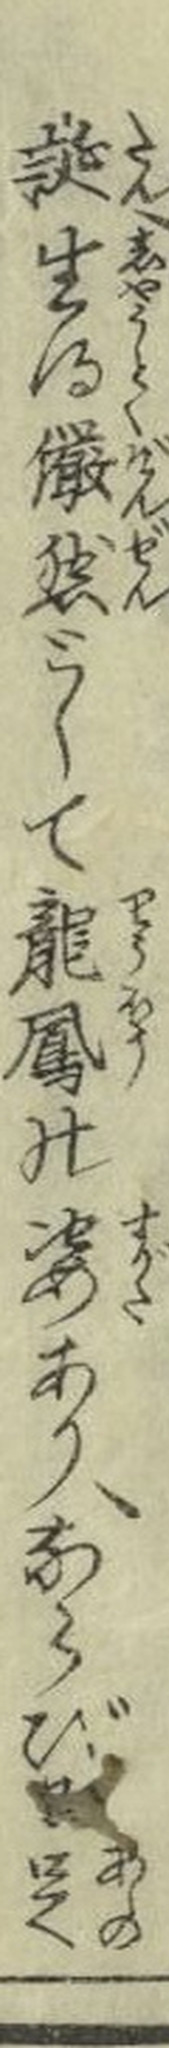誕、生得儼然として龍鳳の姿あり、ならびに足
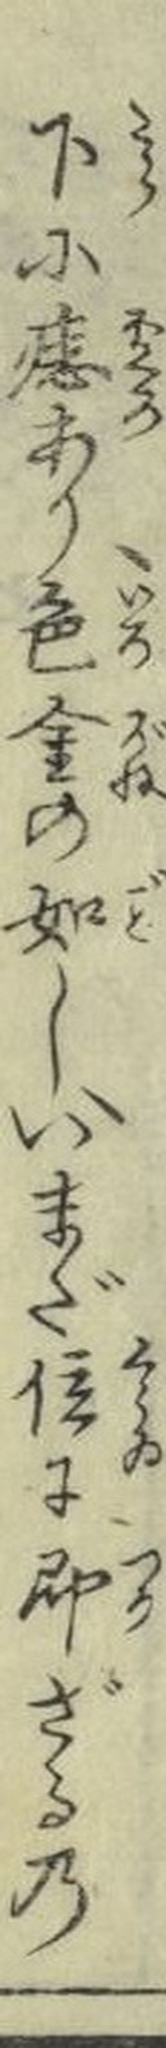下に痣あり、色金の如し、いまだ位に即ざるの
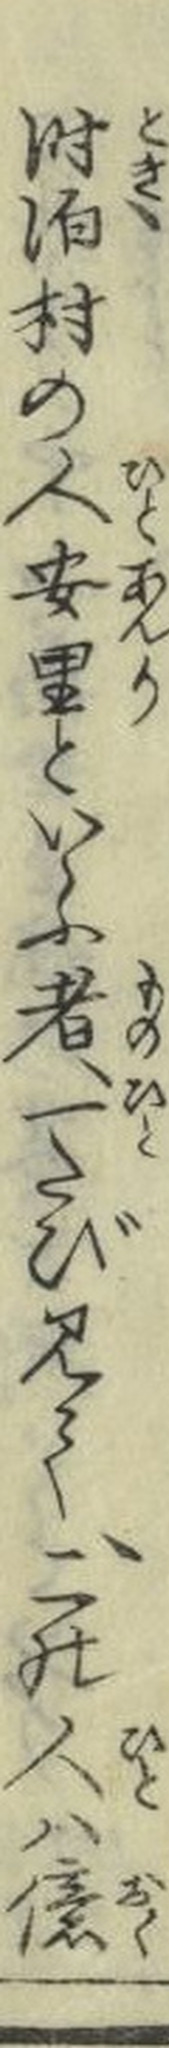時、泊村の人安里といふ者、一たび見て、この人は億
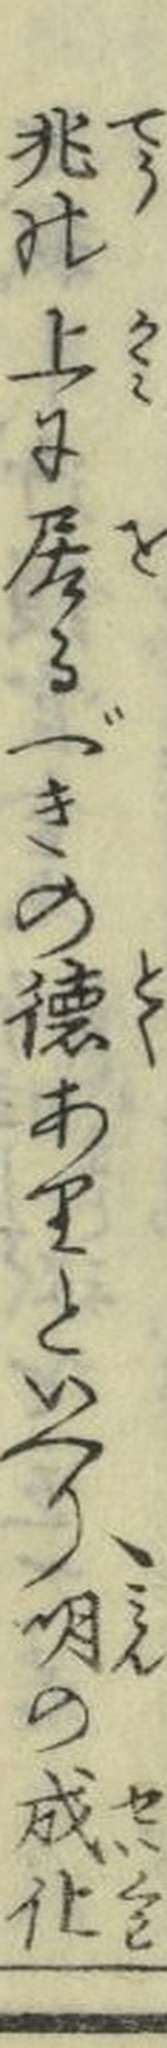兆の上に居るべきの徳ありといへり、明の成化
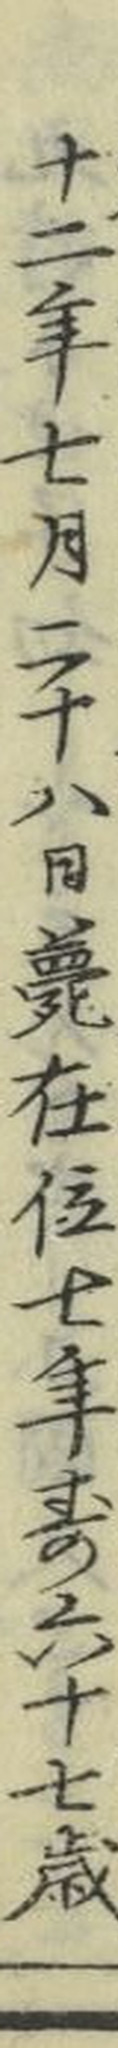十二年七月二十八日薨、在位七年寿六十七歳、
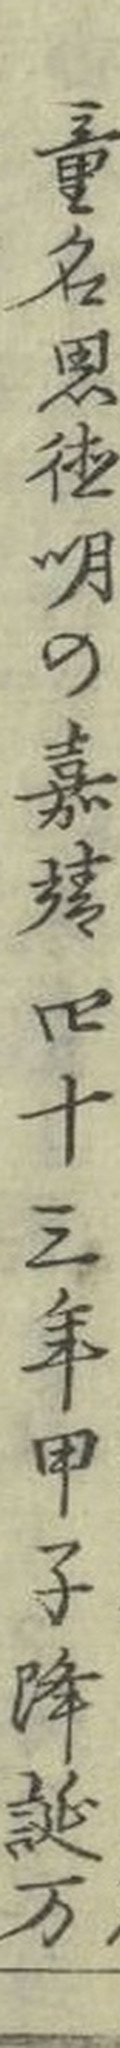童名思徳、明の嘉靖四十三年甲子降誕、万
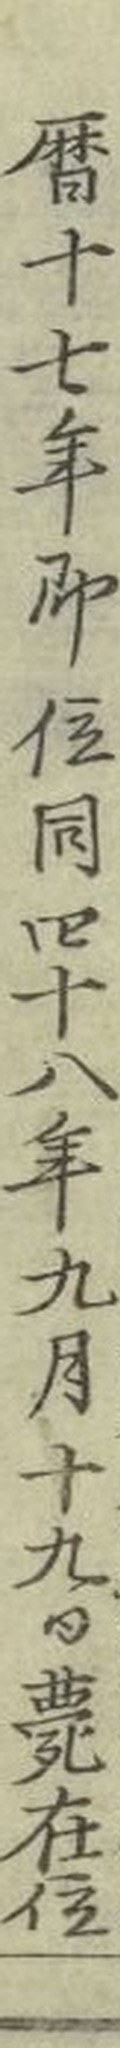暦十七年即位、同四十八年九月十九日薨、在位
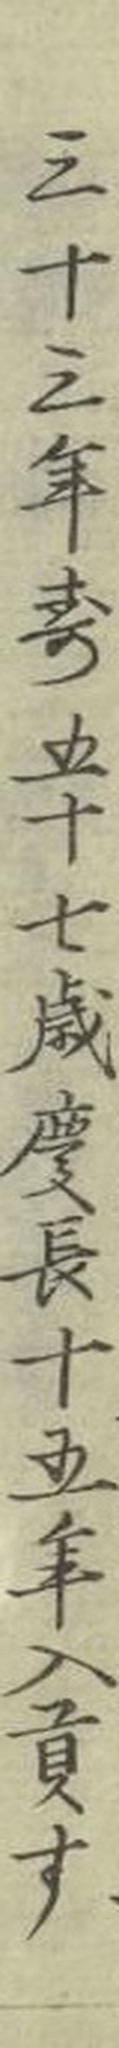三十三年、寿五十七歳、慶長十五年入貢す、

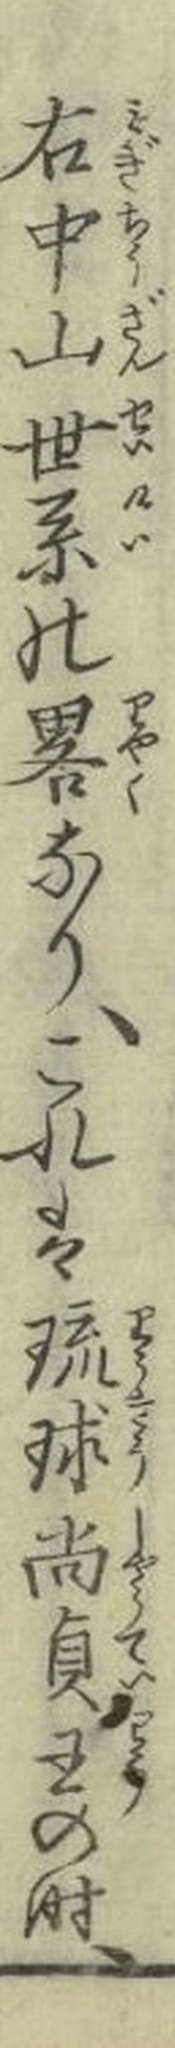右中山世系の略なり、これは琉球尚貞王の時、
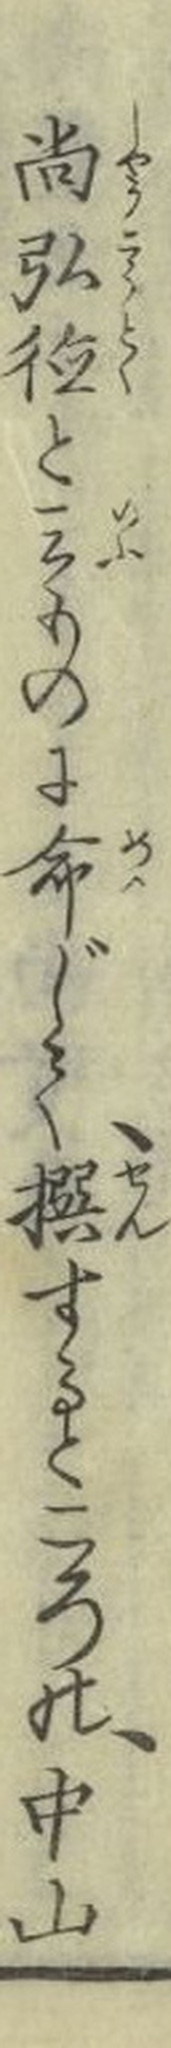尚弘徳と云ものに命じて、撰するところの、中山
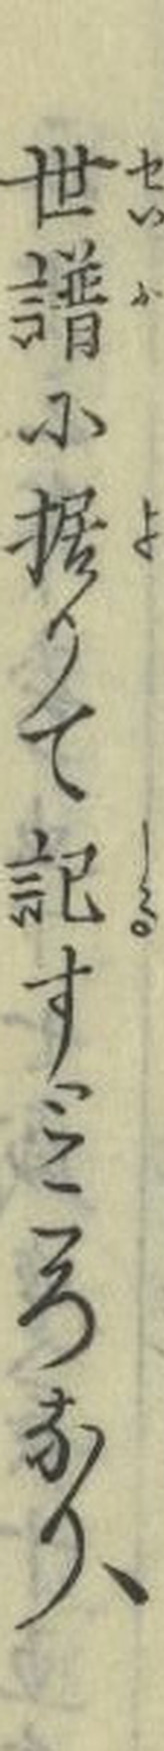世譜に据りて記すところなり、
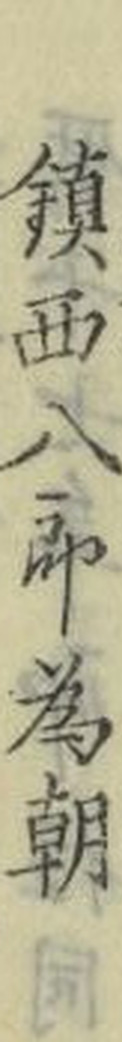鎮西八郎為朝
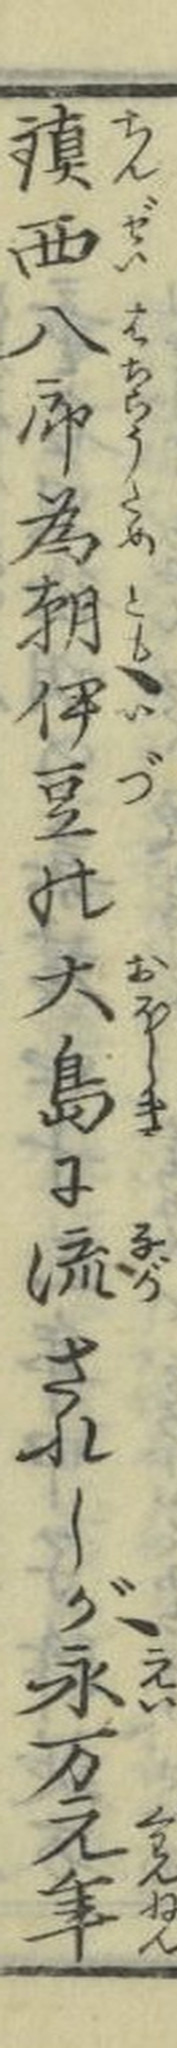鎮西八郎為朝、伊豆の大島に流されしが、永万元年
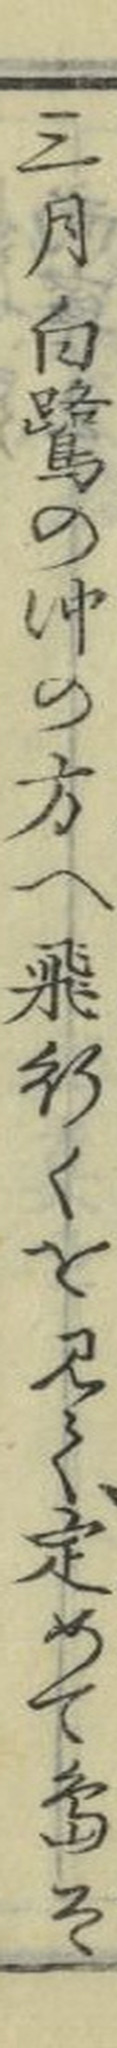三月、白鷺の沖の方へ飛行くを見て、定めて島ぞ
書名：琉球入貢紀略
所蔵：University of the Ryukyus Library
